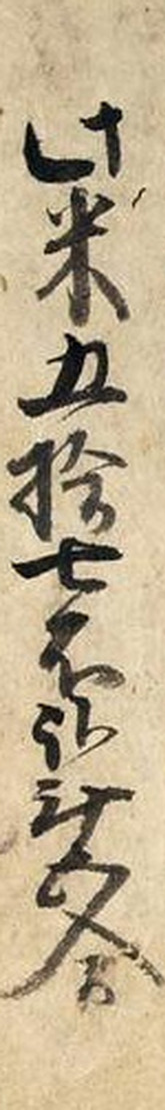此米五拾七石弐斗五合
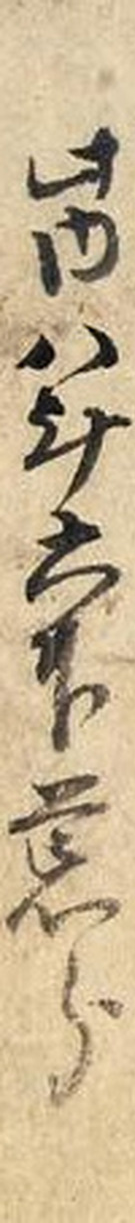此内八斗六升荒分

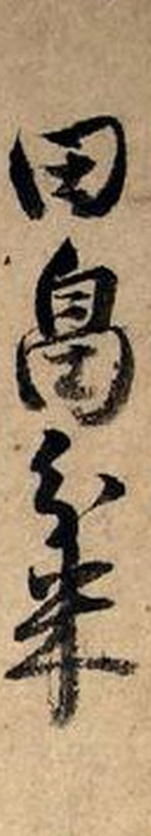田畠分米
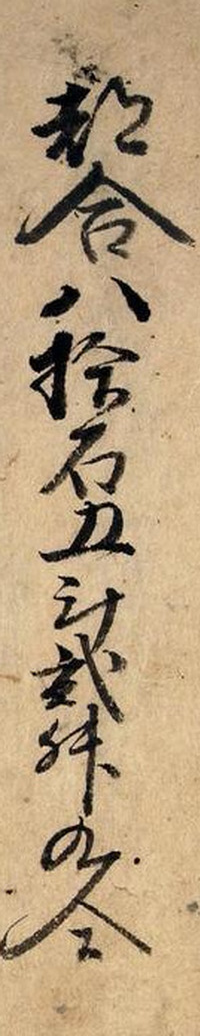都合八拾石五斗弐升九合
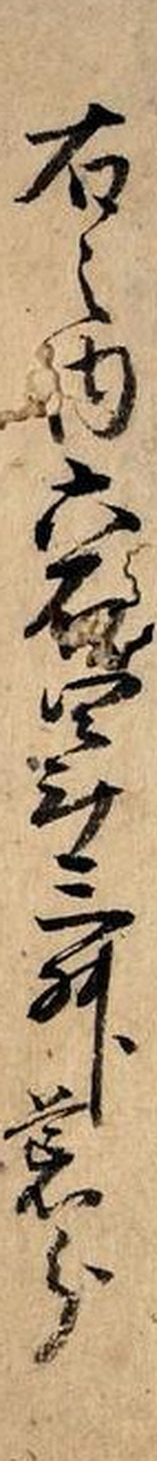右之内六石四斗三升荒分
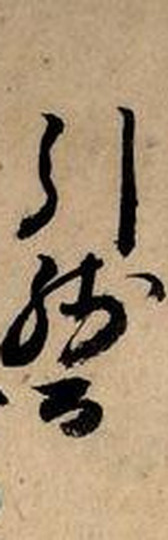引残而
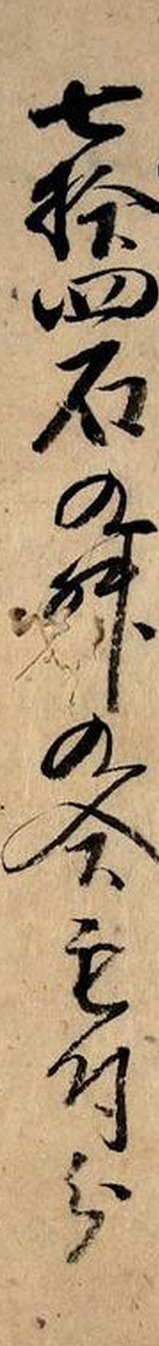七拾四石九升九合毛付分
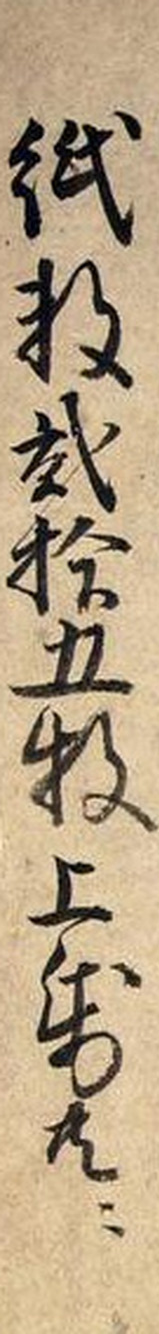紙数弐拾五枚上紙共ニ

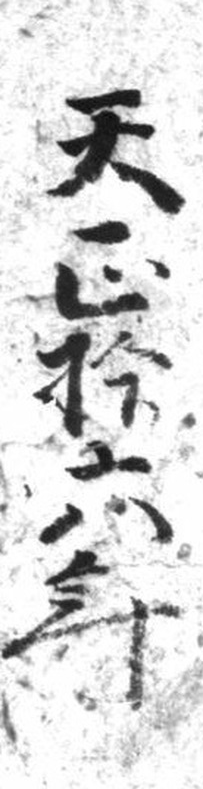天正拾六年
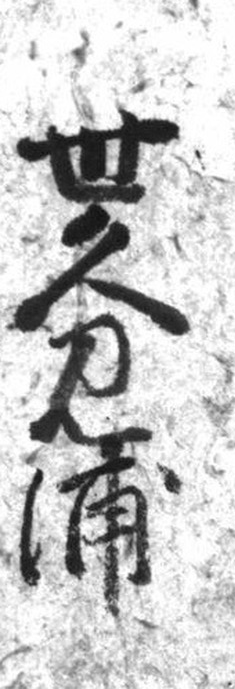世久見浦
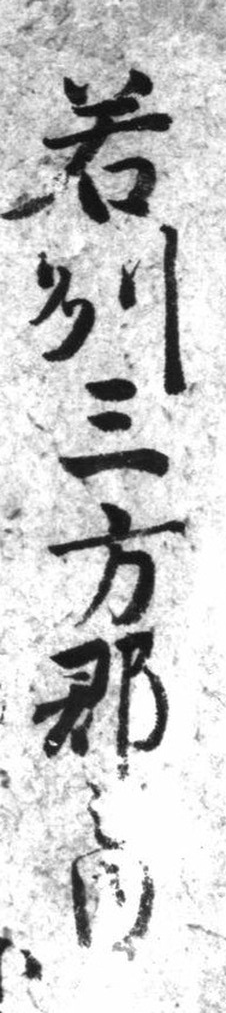若州三方郡之内
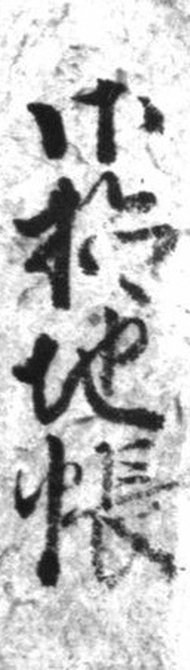御検地帳
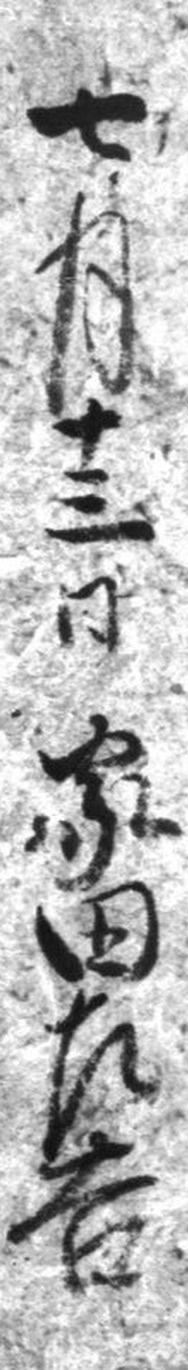七月十三日家田左吉

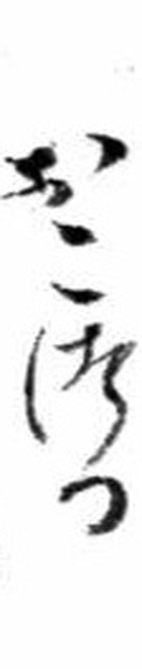おこつる
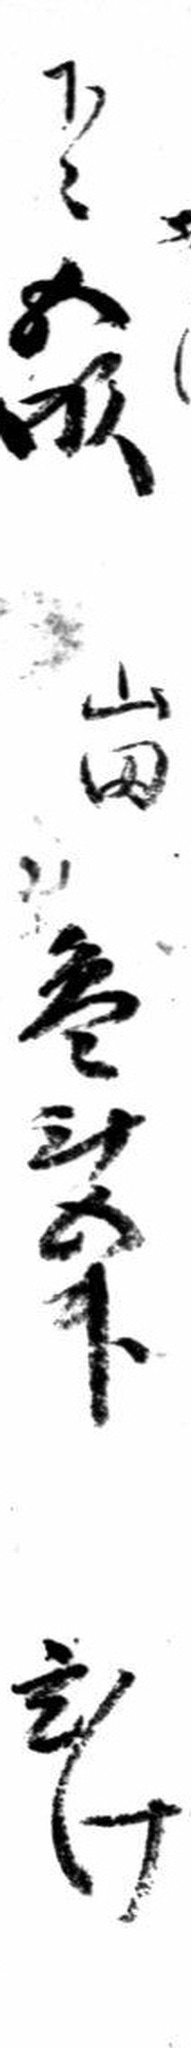下々五畝山田参斗五升ひけ
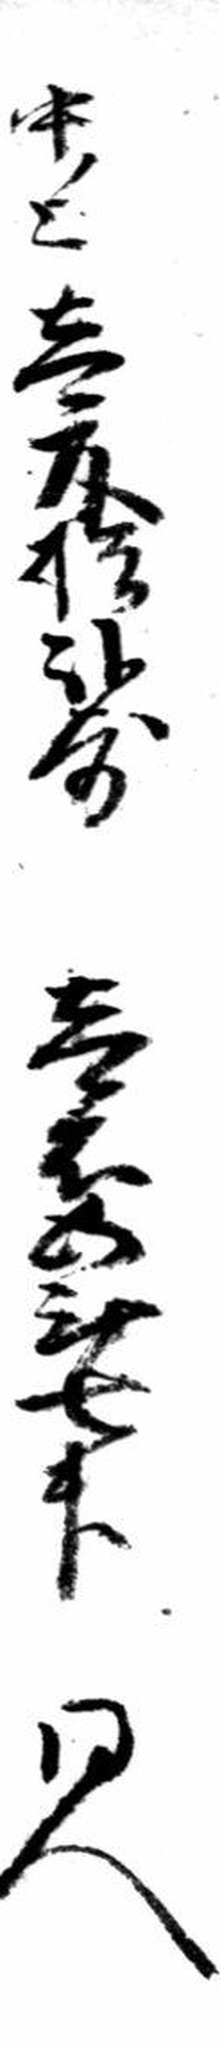中ノ上壱反拾弐歩壱石五斗七升同人
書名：若州三方郡之内世久見浦御検地帳（世久見浦検地帳写）
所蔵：福井県文書館 Fukui Prefectural Archives
